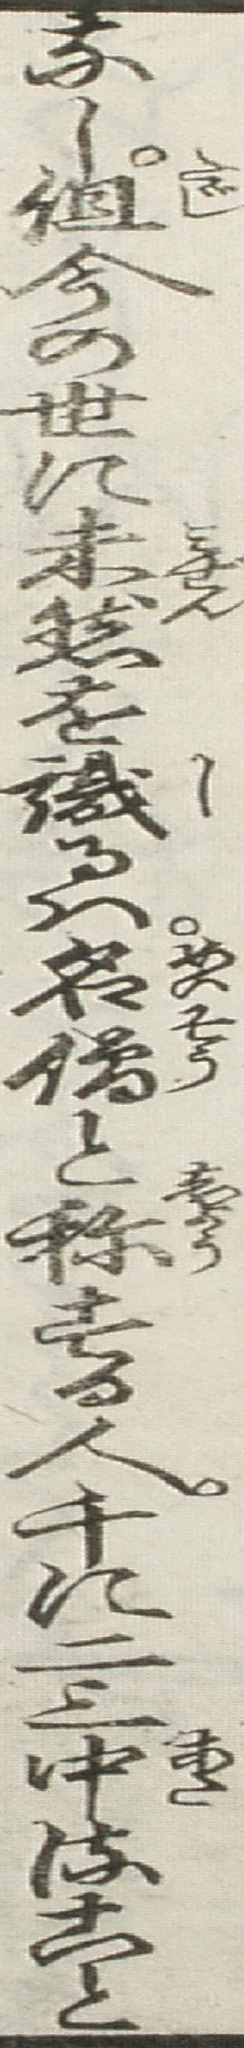なし。但今の世に未然を識るは。名僧と称する人。千にニ三中ること
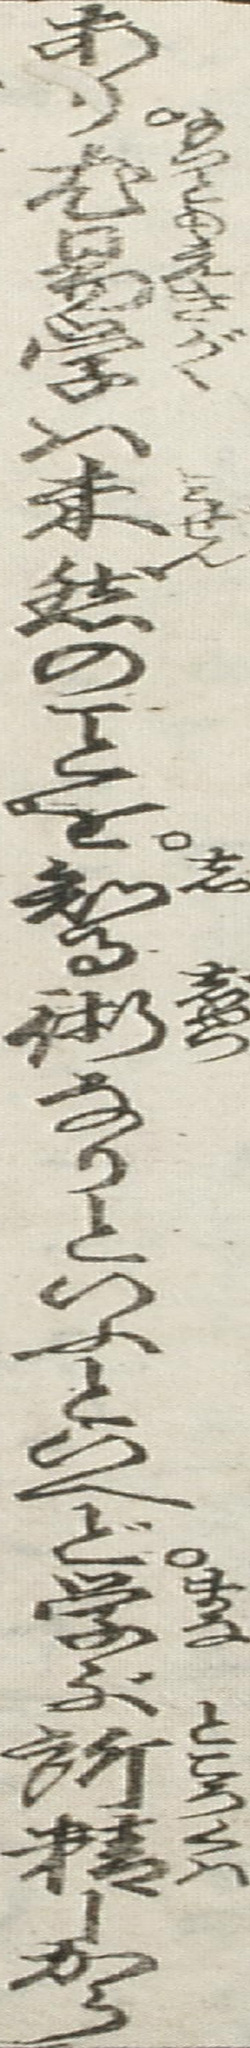あり。尤易学は未然のことを。知る術なりといふといへど。学ぶ所精しから
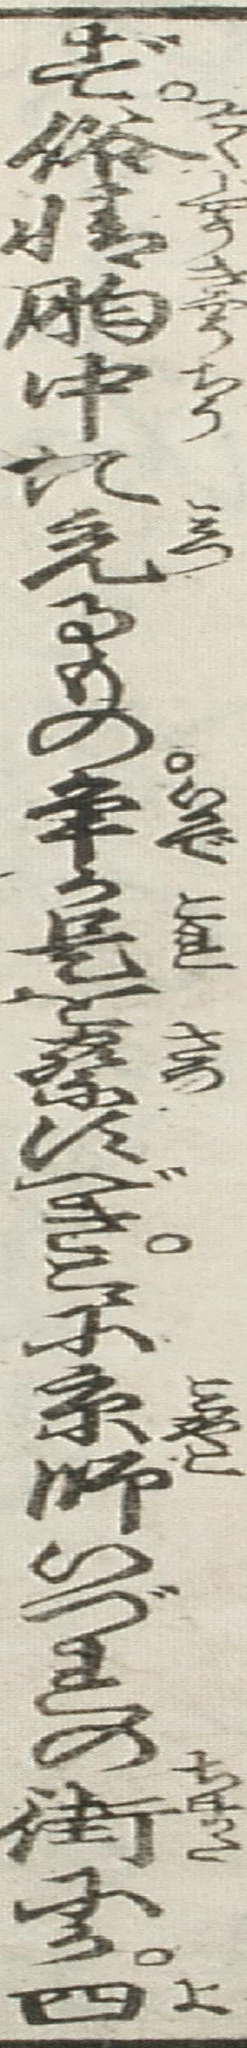ず。俗情胸中に充るもの。争か是を察すべき。こゝに京師いづれの街にか。四
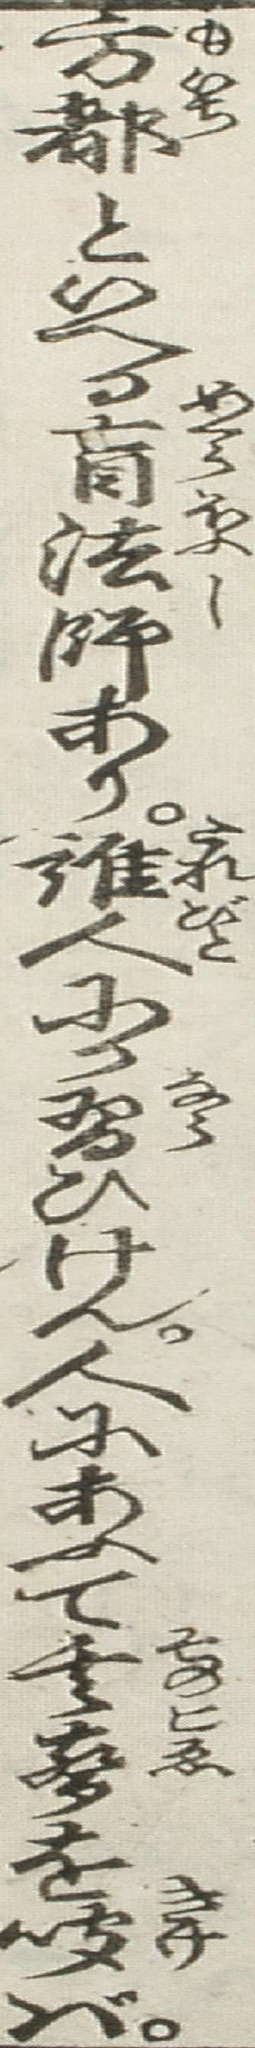方都といへる盲法師あり。誰人にか習ひけん。人にあふて其声を聞ば。
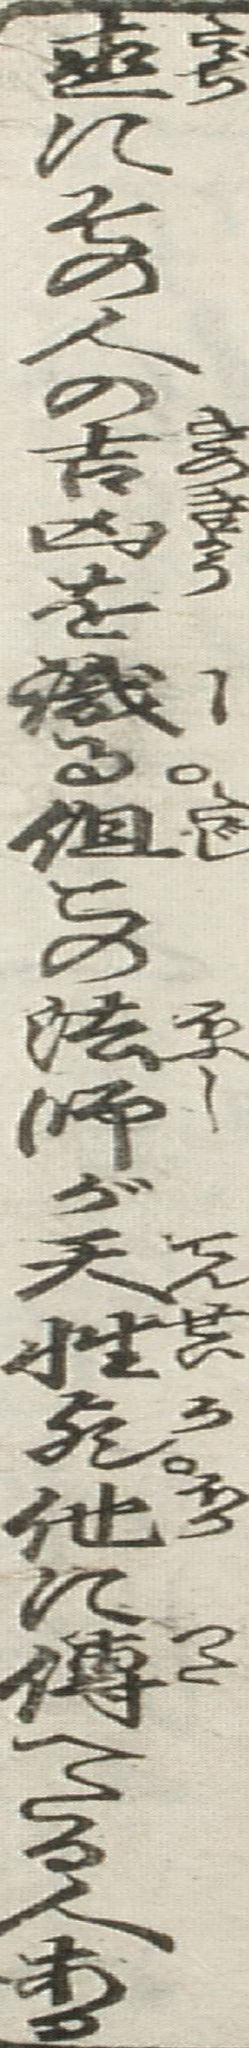直にその人の吉凶を識る。但この法師が天性歟。他に伝へたる人ある
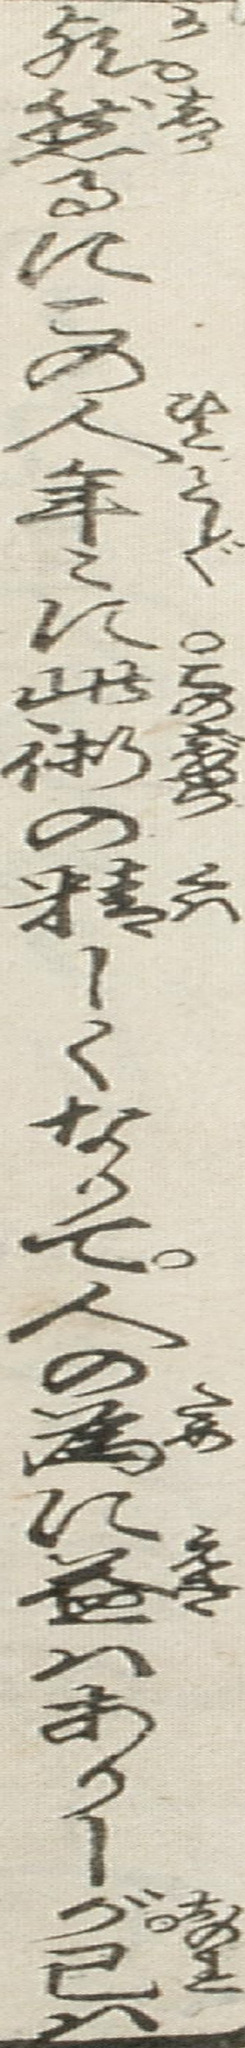歟。然るにこの人年〻に。此術の精しくなりて。人の為に益はありしが。己は
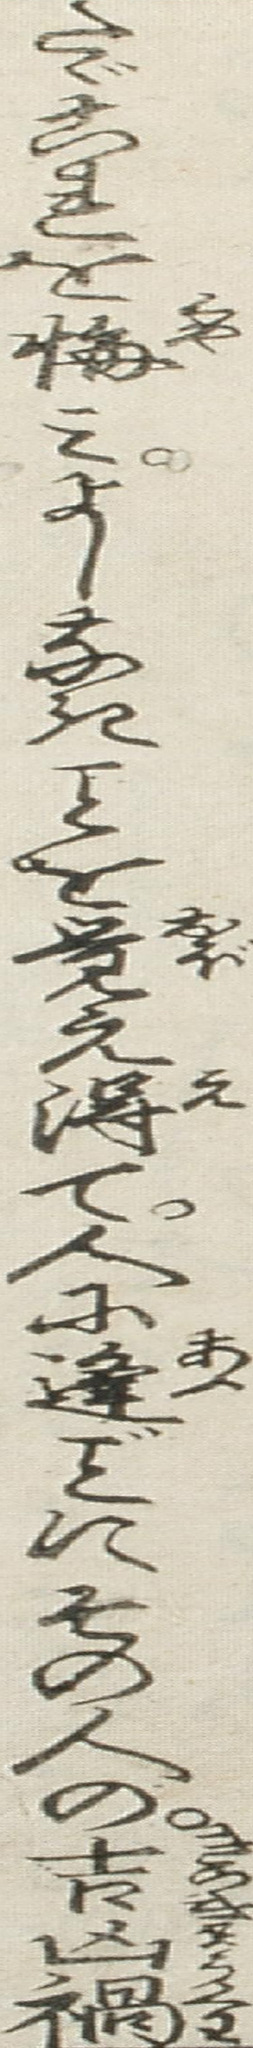たゞこれを悔み。よしなきことを覚え得て。人に逢ごとにその人の。吉凶禍
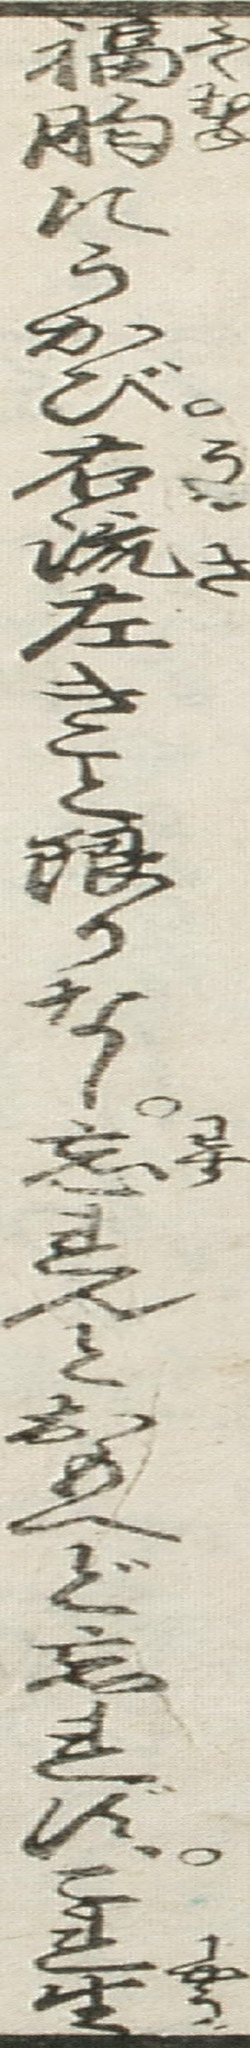福胸にうかび。右流左きこと限りなし。忘れんとおもへど忘れず。これ生
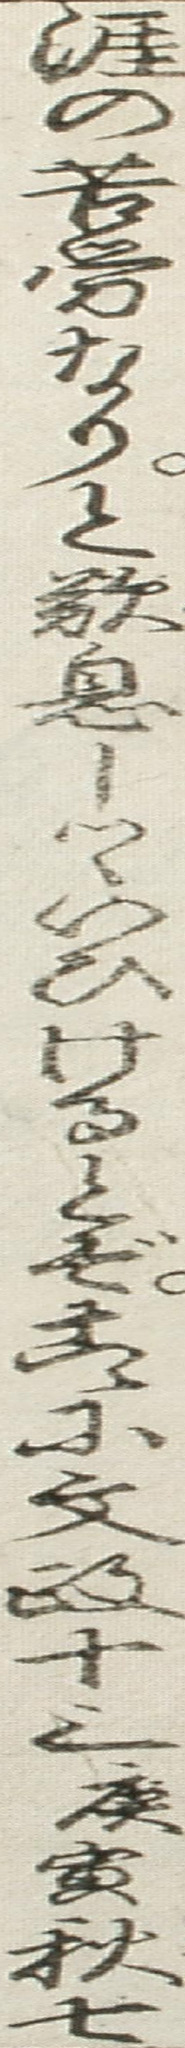涯の苦労なり。と嘆息しツヽいひけるとぞ。こゝに文政十三庚寅秋七
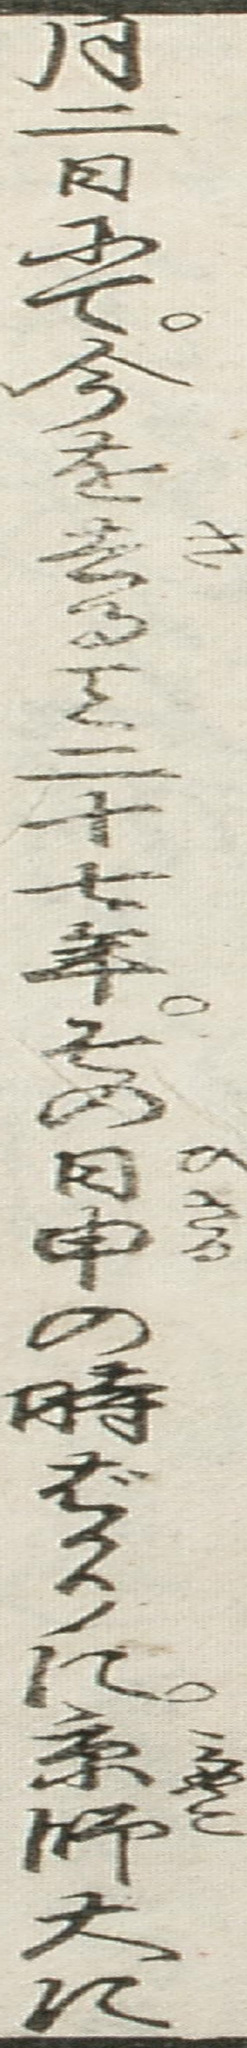月二日にて。今を去ること二十七年。その日申の時ばかりに。京師大に
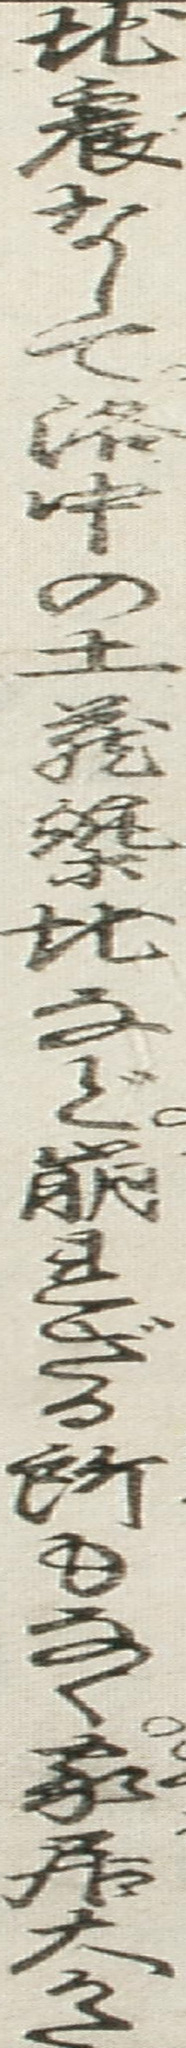地震なして。洛中の土蔵築地など。崩れざる所もなく。家居大かた
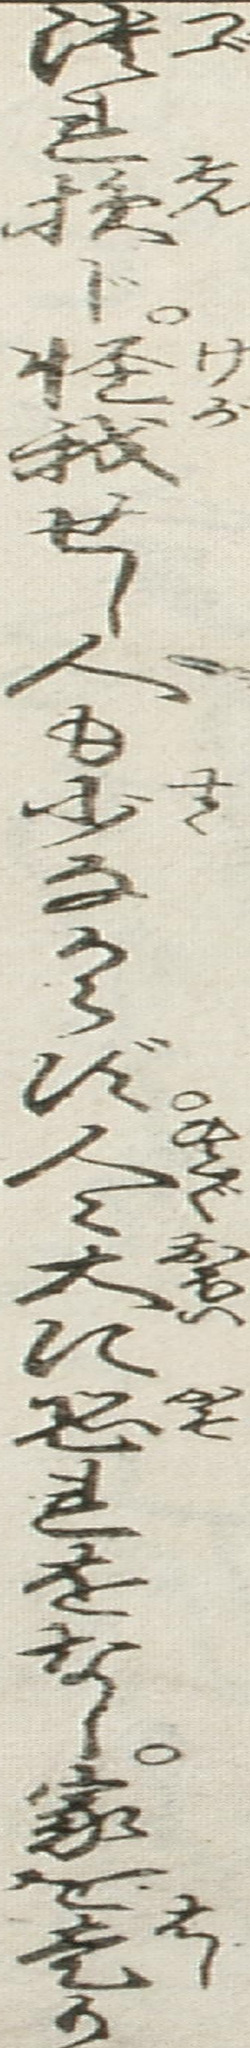潰れ損じ。怪我せし人も少なからず。人〻大に恐れをなし。家を走り
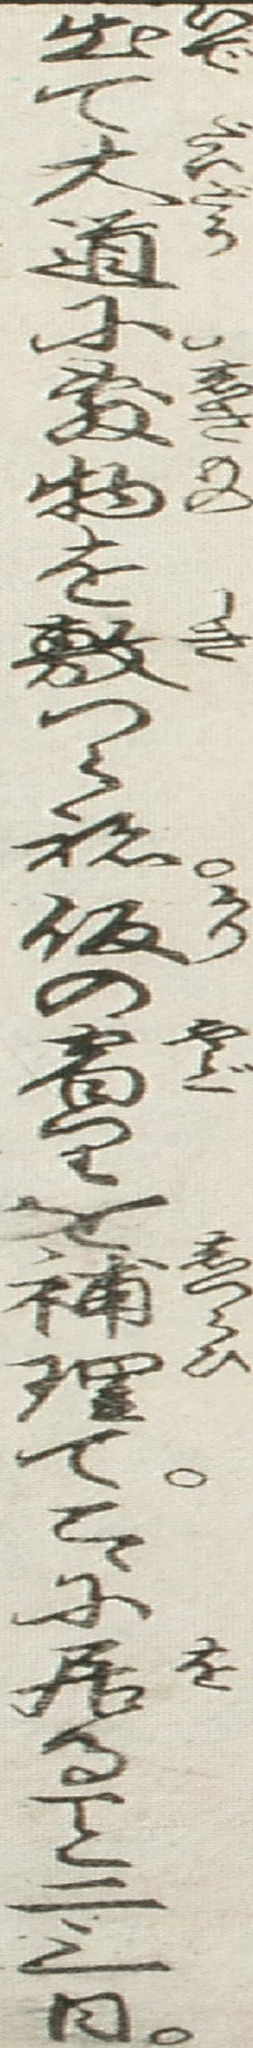出て大道に。敷物を敷つらね。仮の宿りを補理て。こゝに居ること二三日。
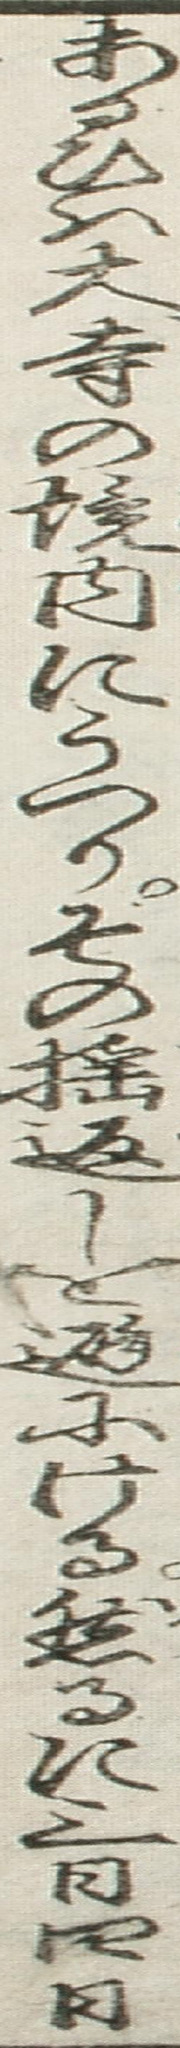あるひは大寺の境内にうつり。その揺返しを避にける。然るに三日四日
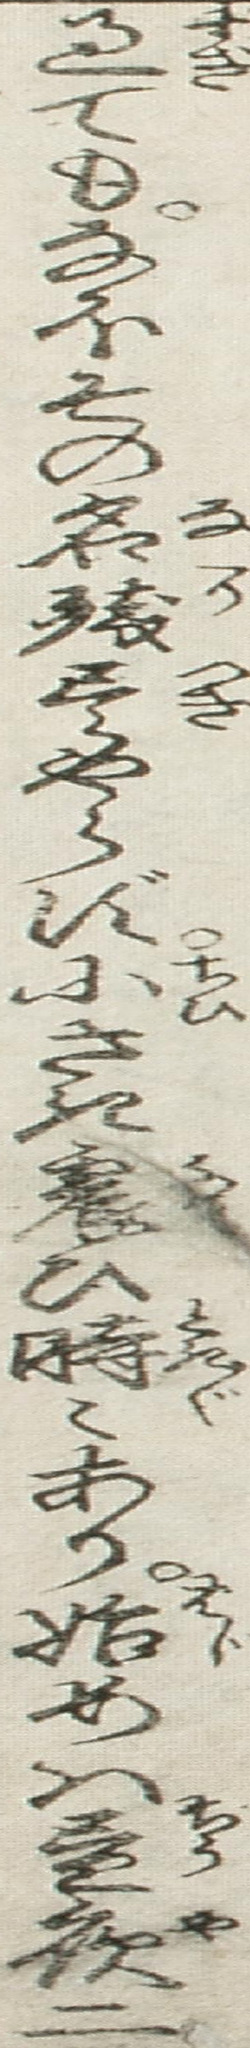過ても。なほその名残尽やらず。小さき震ひ時〻あり。始めは昼夜二
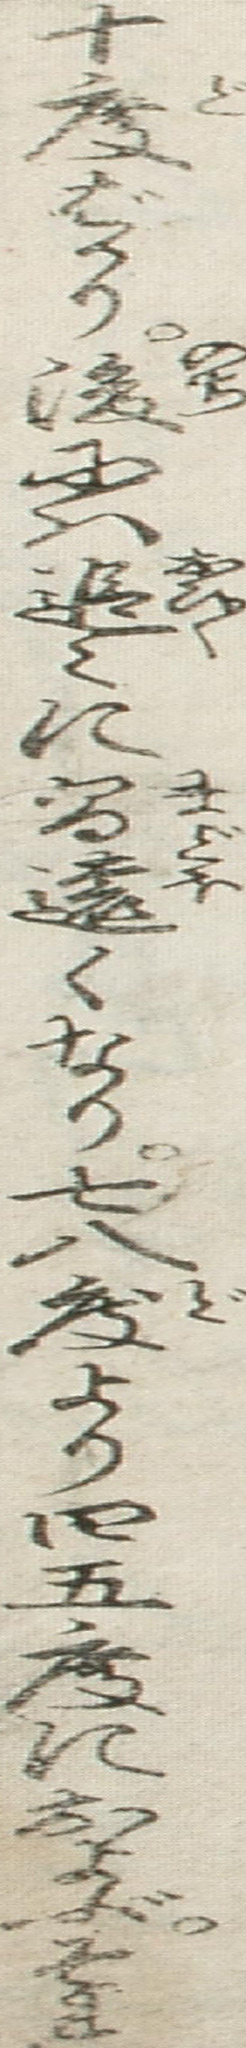十度ばかり。後には追〻に間遠くなり。七八度より四五度におよぶ。それ
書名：安政見聞録　下
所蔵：東京大学地震研究所図書室 Earthquake Research Institute Library, The University of Tokyo, JAPAN
